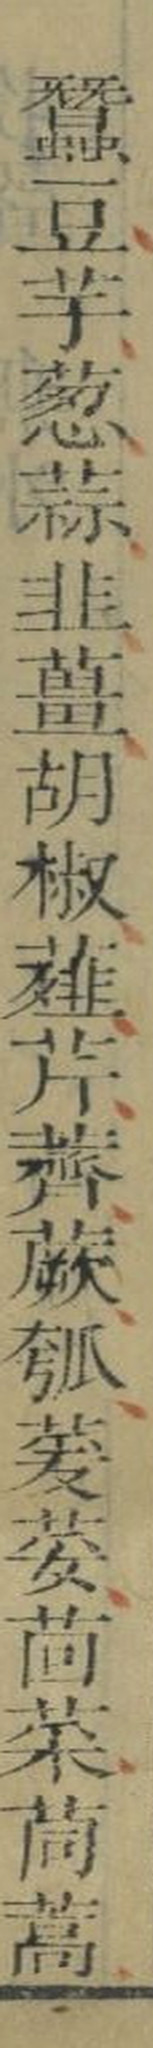蚕豆芋葱蒜韭薑胡椒薤芹薺蕨瓠萲荽茴菜茼蒿
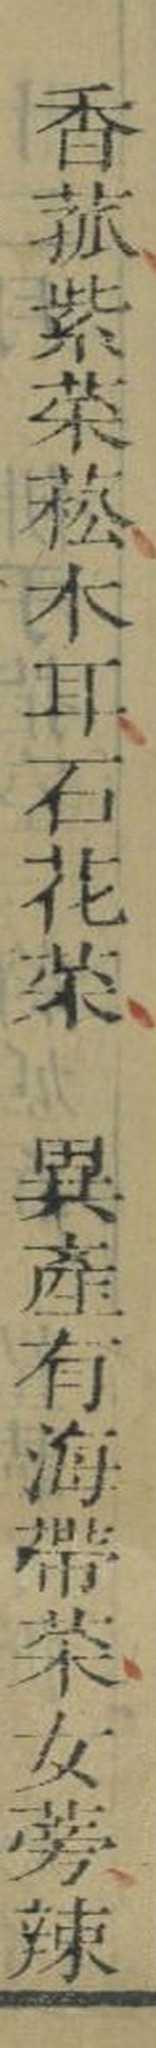香菰紫菜菘木耳石花菜異産有海帯菜女蒡辣
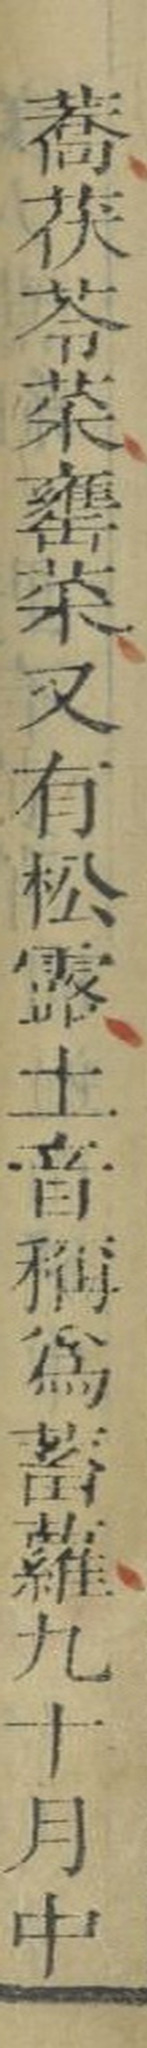蕎茯苓菜罋菜又有松露土音称為蓄蘿九十月中
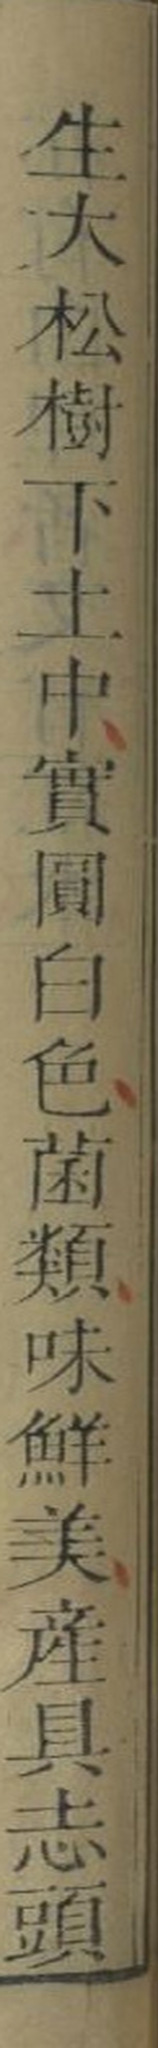生大松樹下土中実円白色菌類味鮮美産具志頭
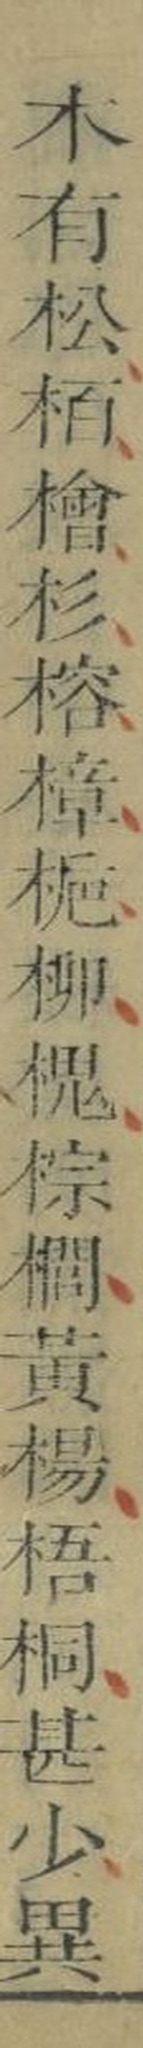木有松栢檜杉榕樟梔柳槐棕櫚黄楊梧桐甚少異
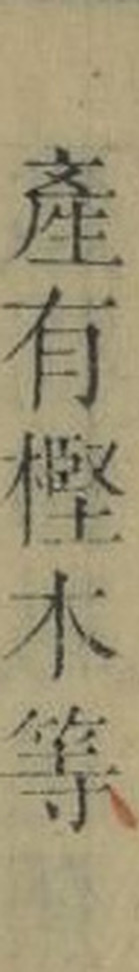産有樫木等
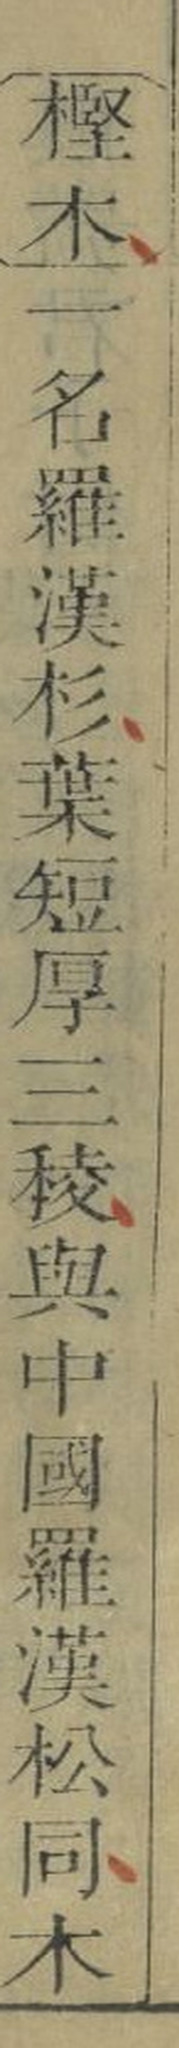[樫木]一名羅漢杉葉短厚三稜与中国羅漢松同木
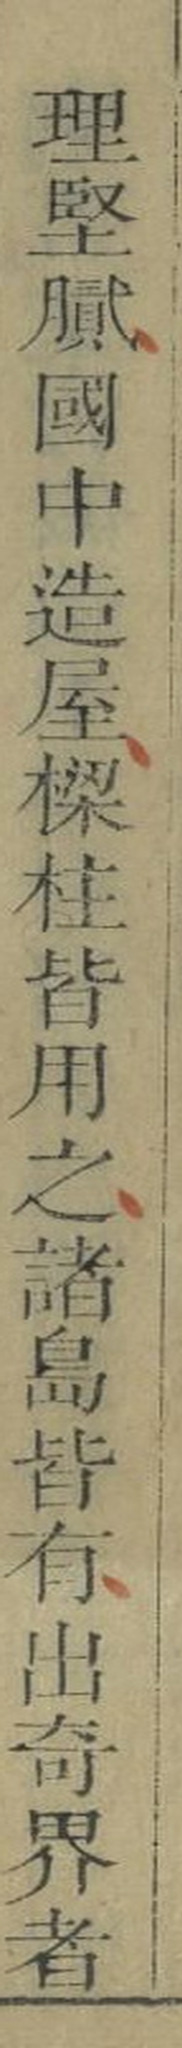理堅膩国中造屋樑柱皆用之諸島皆有出奇界者
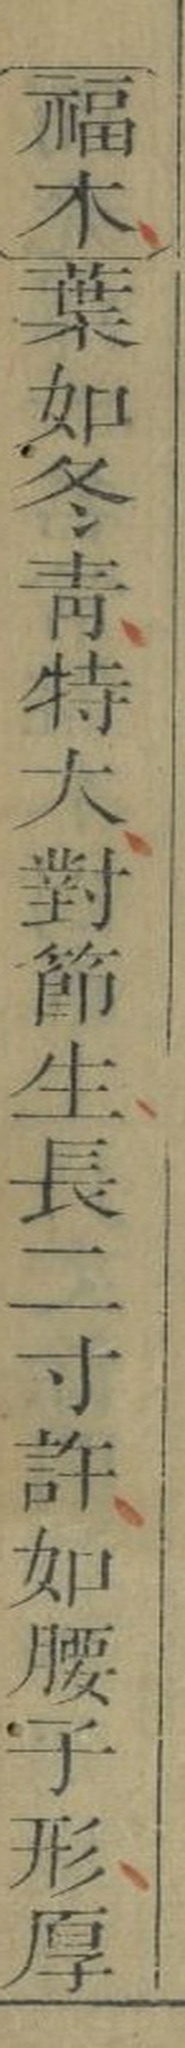[福木]葉如冬青特大対節生長二寸許如腰子形厚

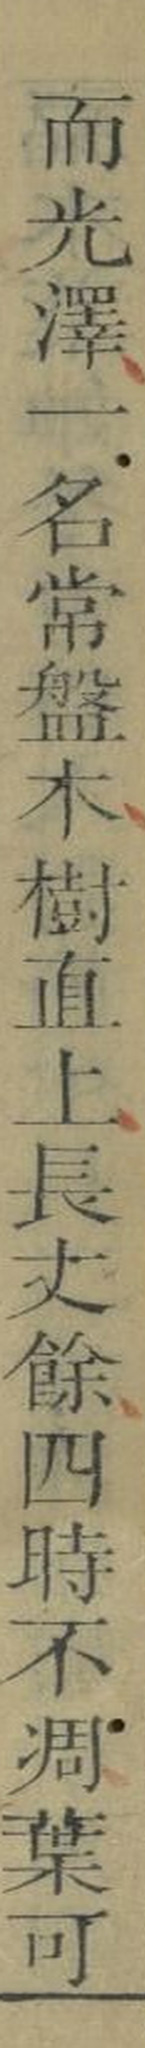而光沢一名常盤木樹直上長丈余四時不凋葉可
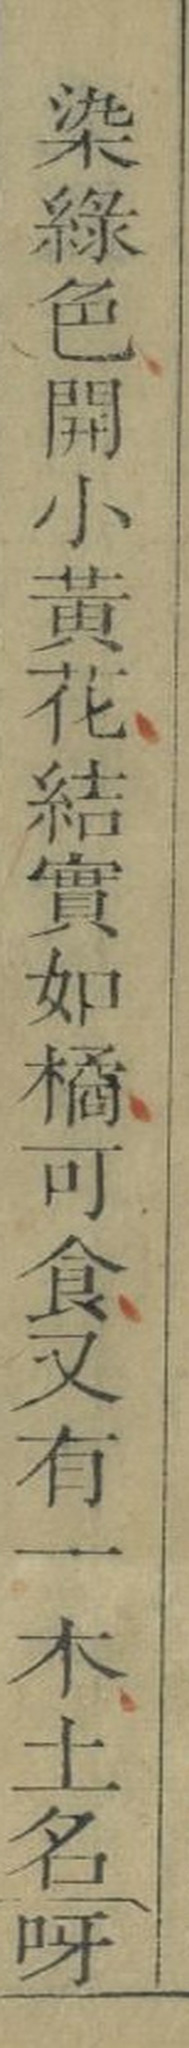染緑色開小黄花結実如橘可食又有一木土名[呀
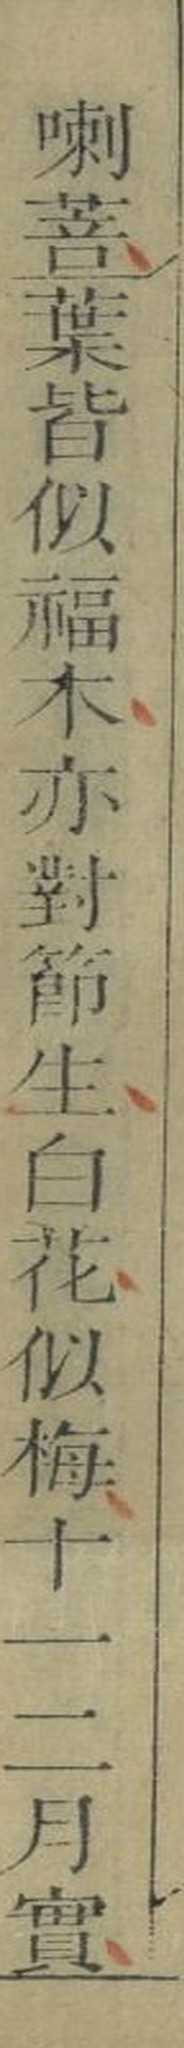喇菩]葉皆似福木亦対節生白花似梅十一二月実
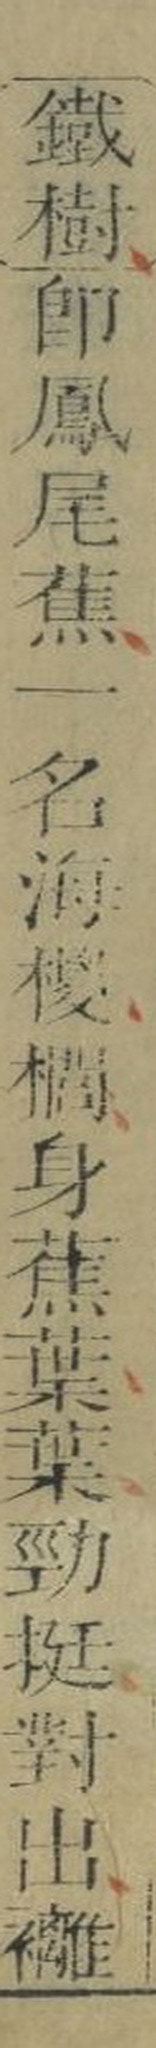[鉄樹]即鳳尾蕉一名海㯶櫚身蕉葉葉勁挺対出䙰
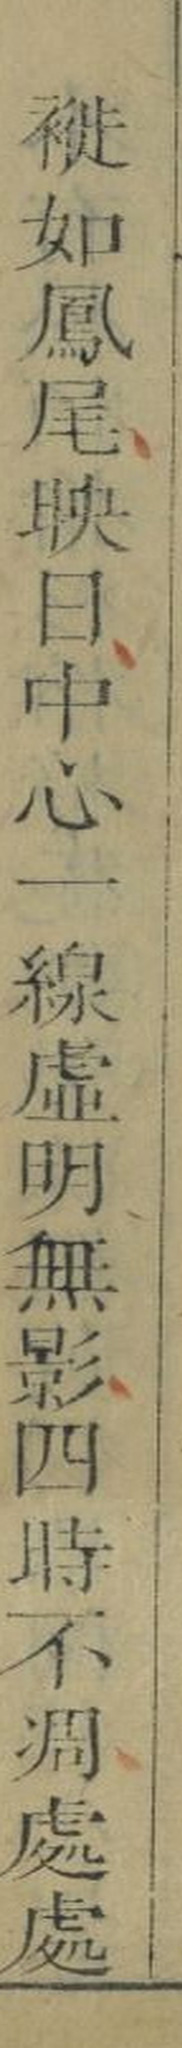褷如鳳尾映日中心一線虚明無影四時不凋処処
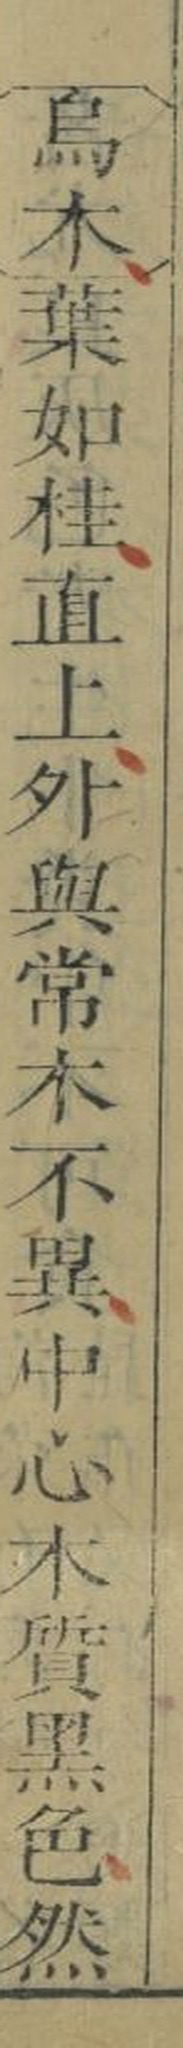[烏木]葉如桂直上外与常木不異中心木質黒色然
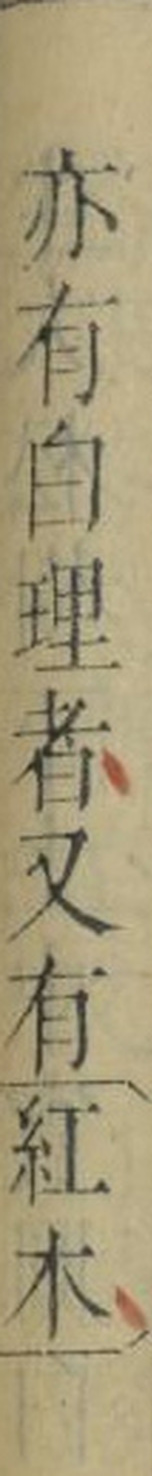亦有白理者又有[紅木]
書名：中山伝信録 巻六
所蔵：University of the Ryukyus Library
